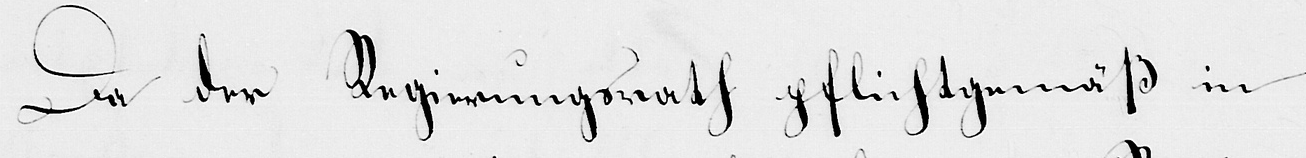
Da der Regierungsrath pflichtgemäß in
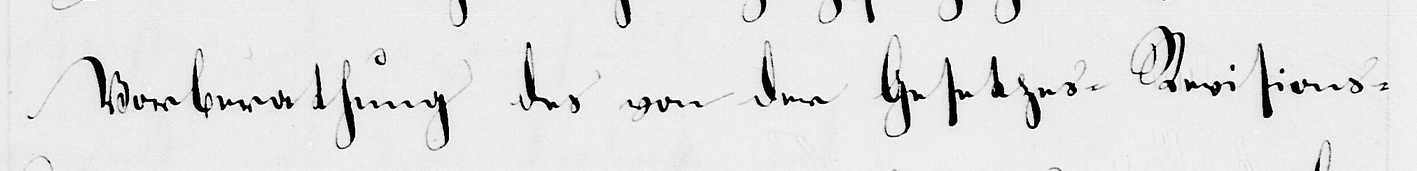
Vorberathung des von der Gesetzes-Revision¬
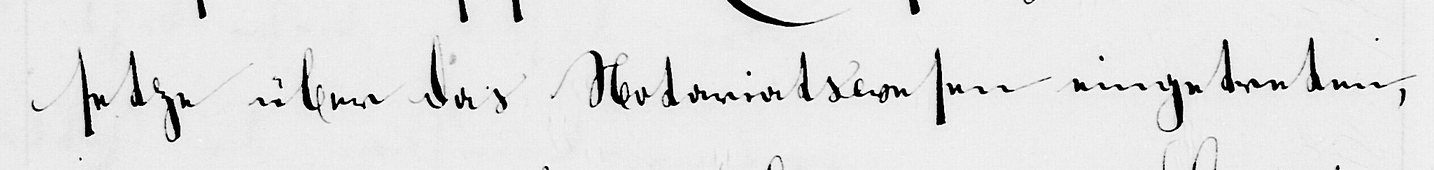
setze über das Notariatswesen eingetreten,
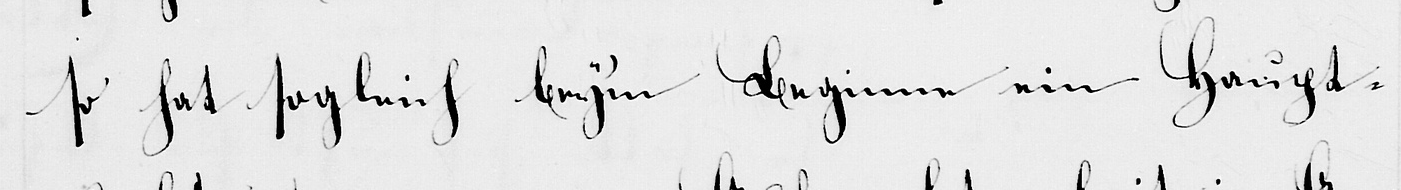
so hat sogleich beym Beginne ein Haupt¬
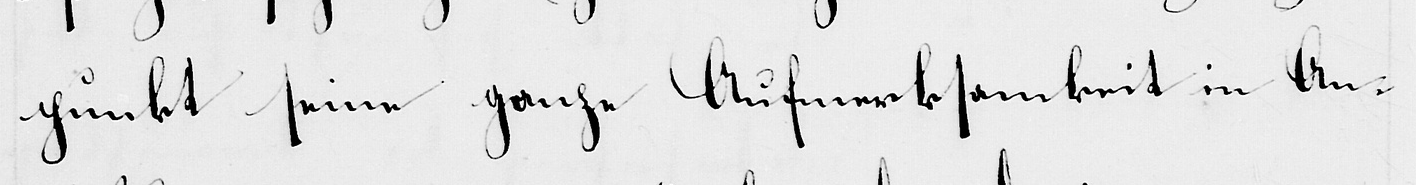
punkt seine ganze Aufmerksamkeit in An¬
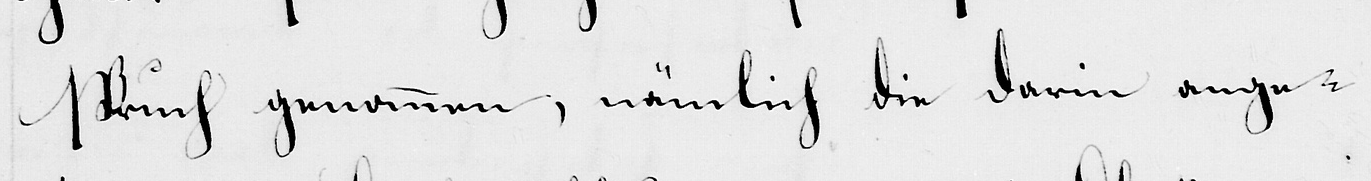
spruch genommen, nämlich die darin ange¬
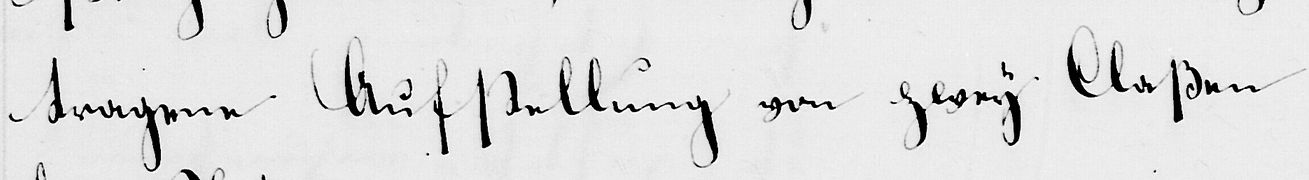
tragene Aufstellung von zwey Claßen
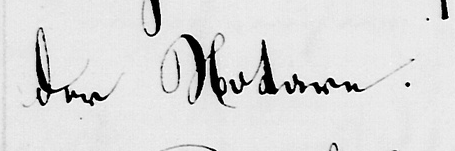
der Notare.
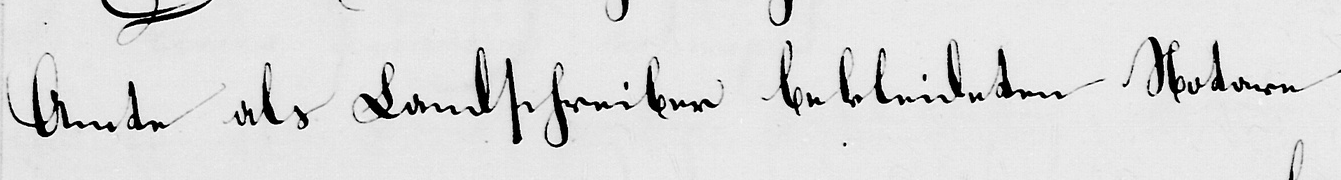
Amte als Landschreiber bekleideten Notare
